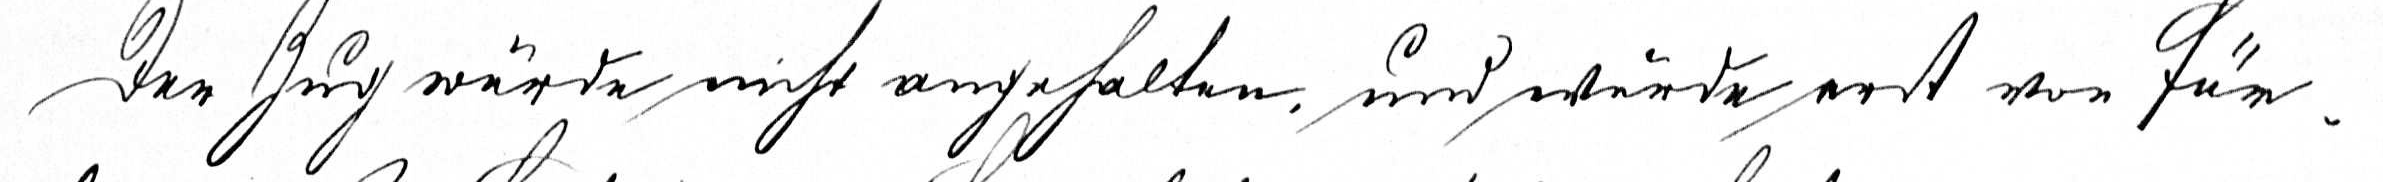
Der Zug würde nicht angehalten und würde erst von Für¬
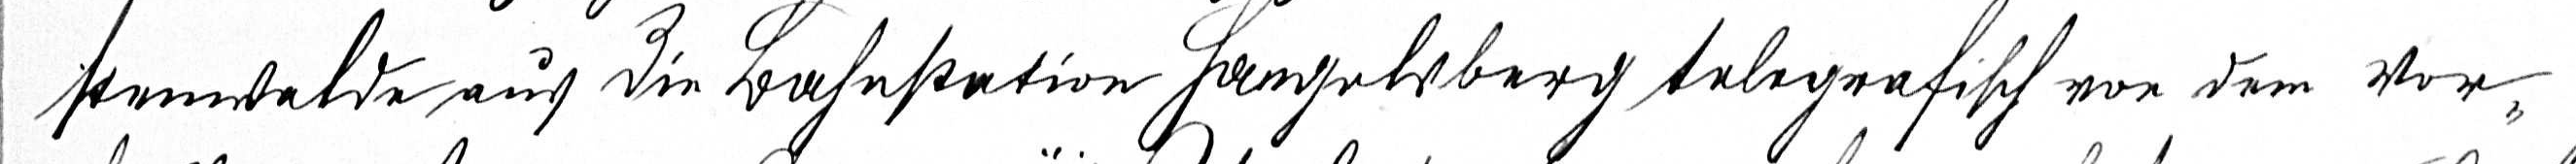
stenwalde aus die Bahnstation Hangelsberg telegrafisch von dem Vor¬
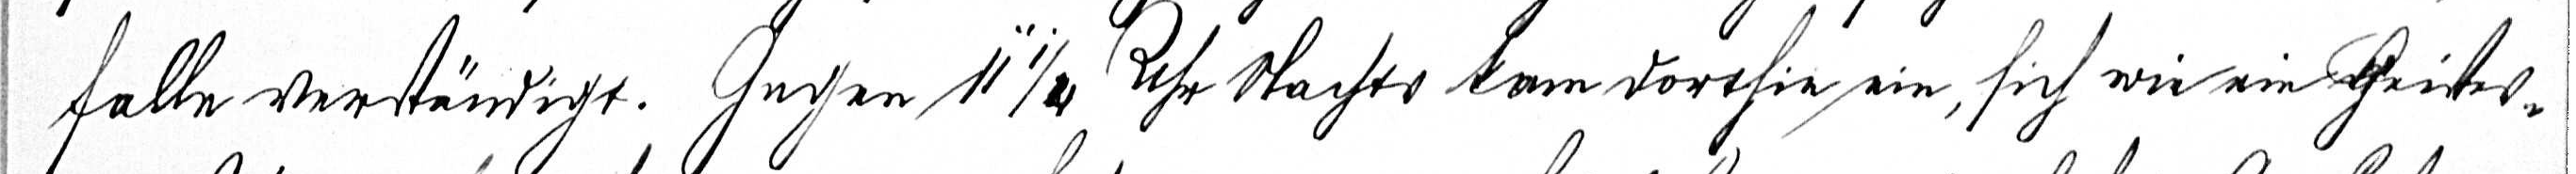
falle verständigt. Gegen 11 ½ Uhr Nachts kam dorthin ein, sich wie ein Geistes¬
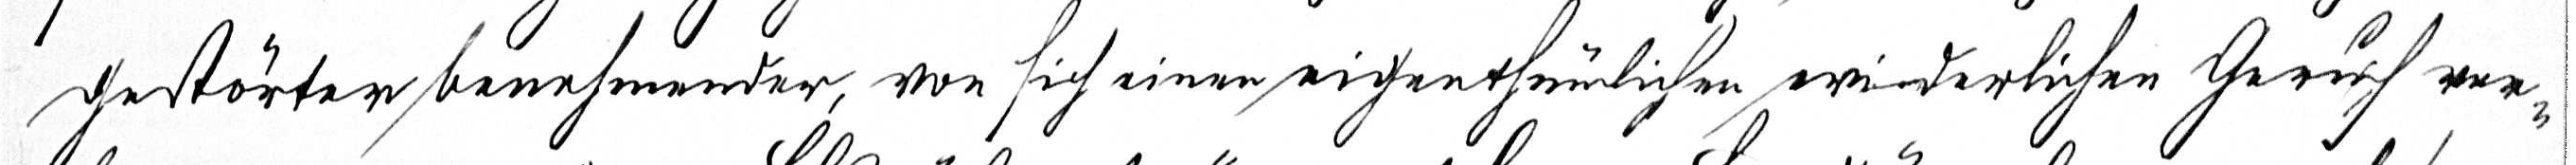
gestörter benehmender, von sich einen eigenthümlichen wiederlichen Geruch ver¬
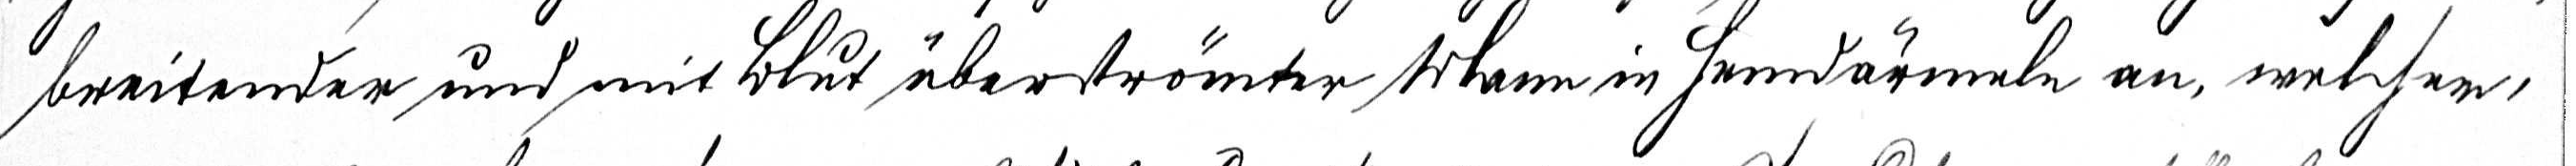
breitender und mit Blut überströmter Mann in Hemdärmeln an, welcher
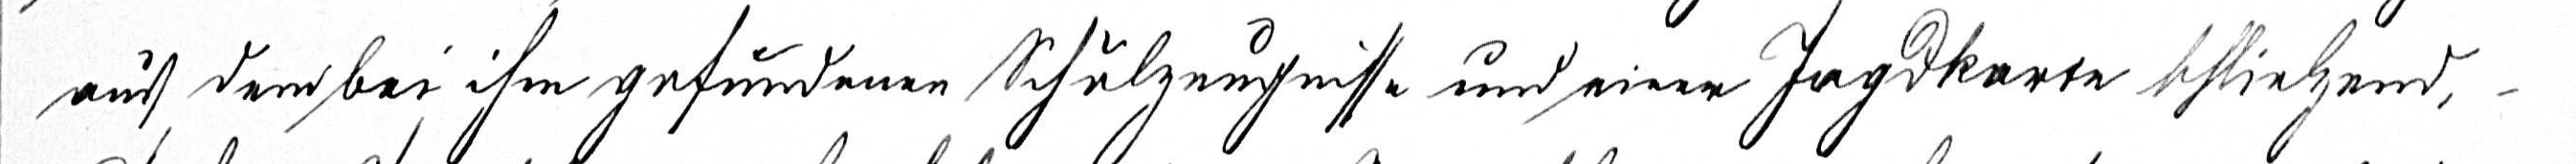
aus dem bei ihm gefundene Schülzeugnisse und einer Jagdkarte schließend,
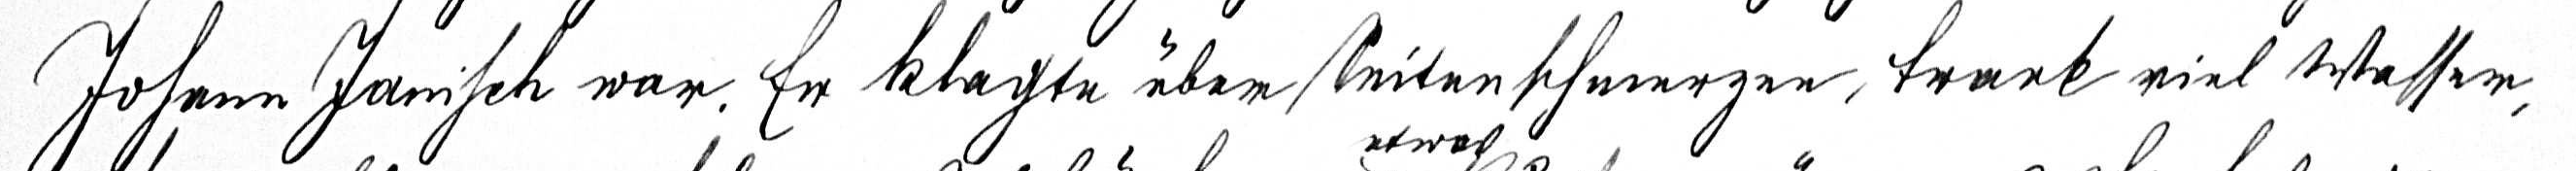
Johann Janisch war. Er klagte über Seitenschmerzen, trank viel Wasser,
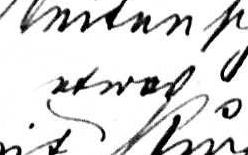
etwas
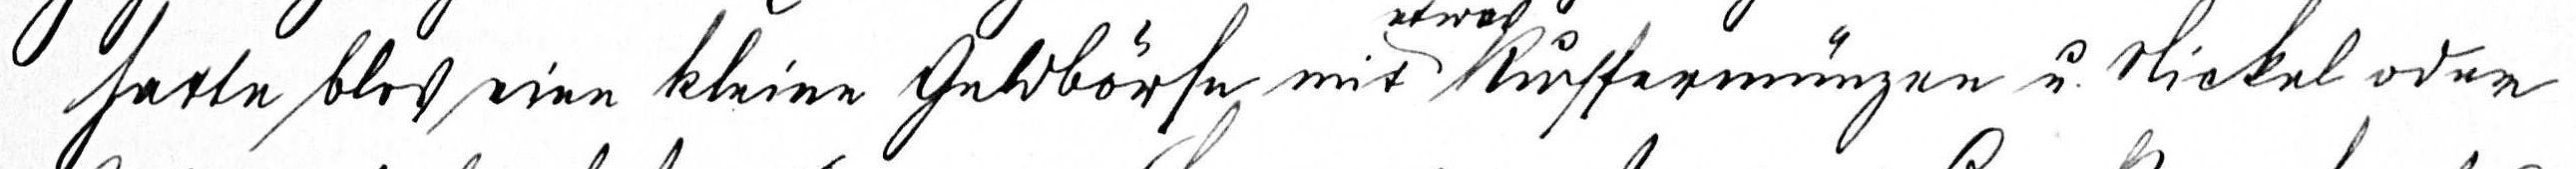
hatte blos eine kleine Geldbörse mit Kupfermünzen u Nickel oder
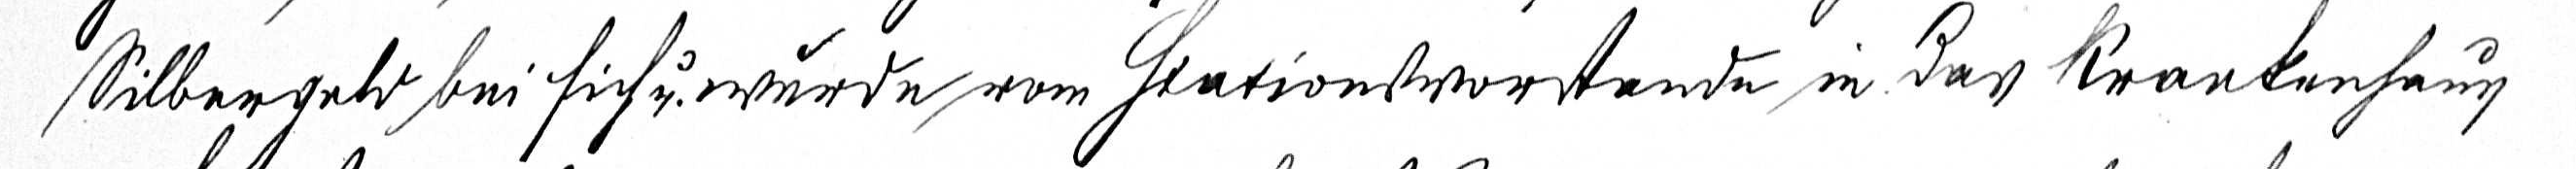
Silbergeld bei sich u wurde vom Stationsvorstande in Bad Krankenhaus
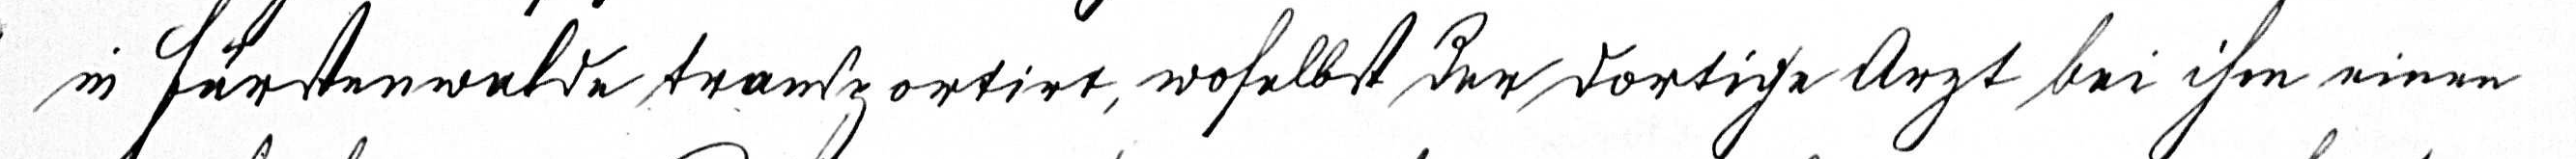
in Fürstenwalde transportirt, woselbst der dortige Arzt bei ihm einen
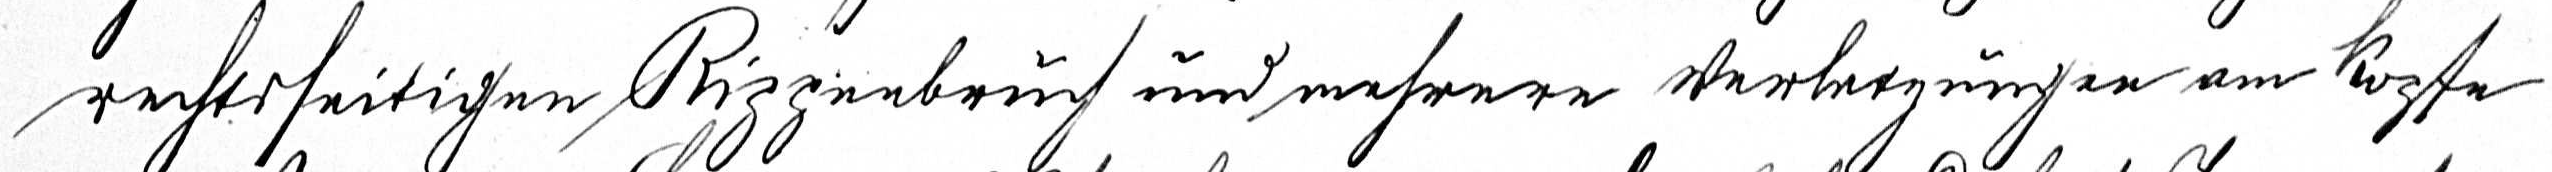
rechtsseitigen Rippenbruch und mehrere Verletzungen am Kopfe
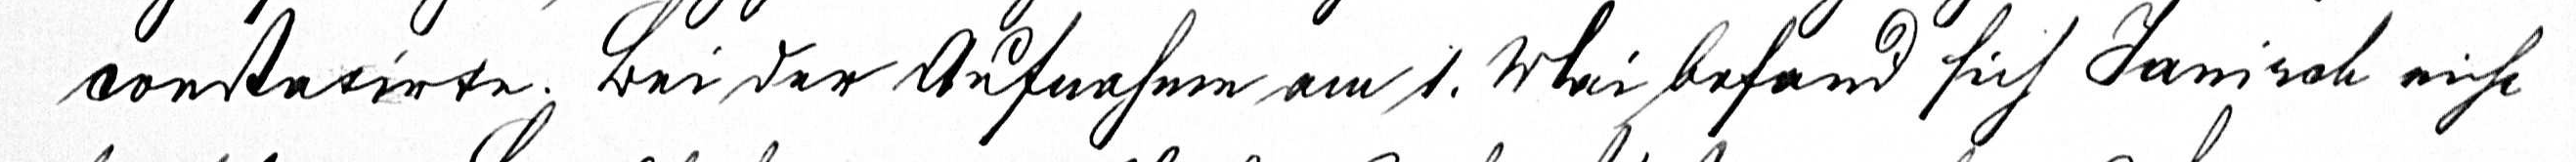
constatirte. Bei der Aufnahme am 1. Mai befand sich Janisch nicht
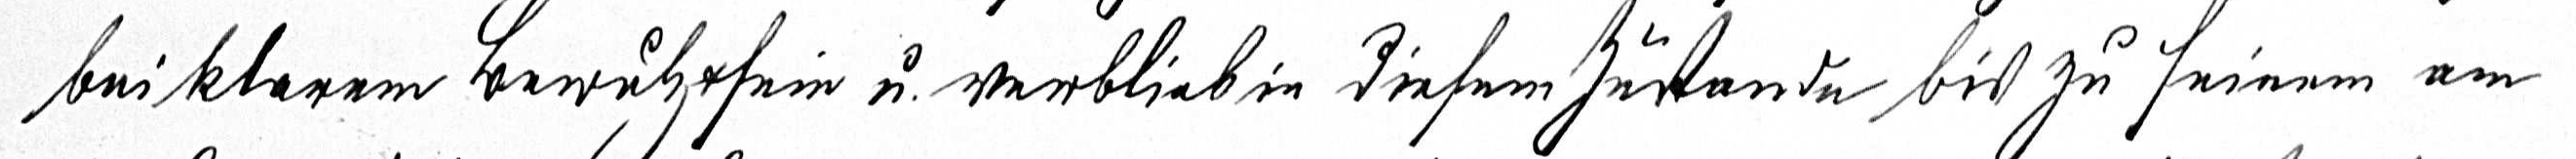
bei klarem Bewüßtsein u verblieb in diesem Zustande bis zu seinem am
